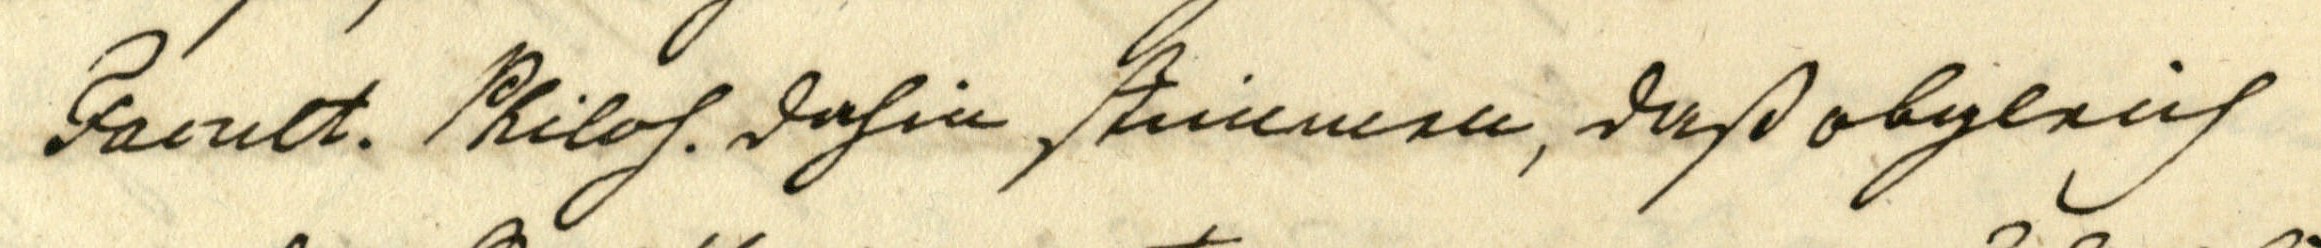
Facult. Philos. dahin stimmen, daß obgleich
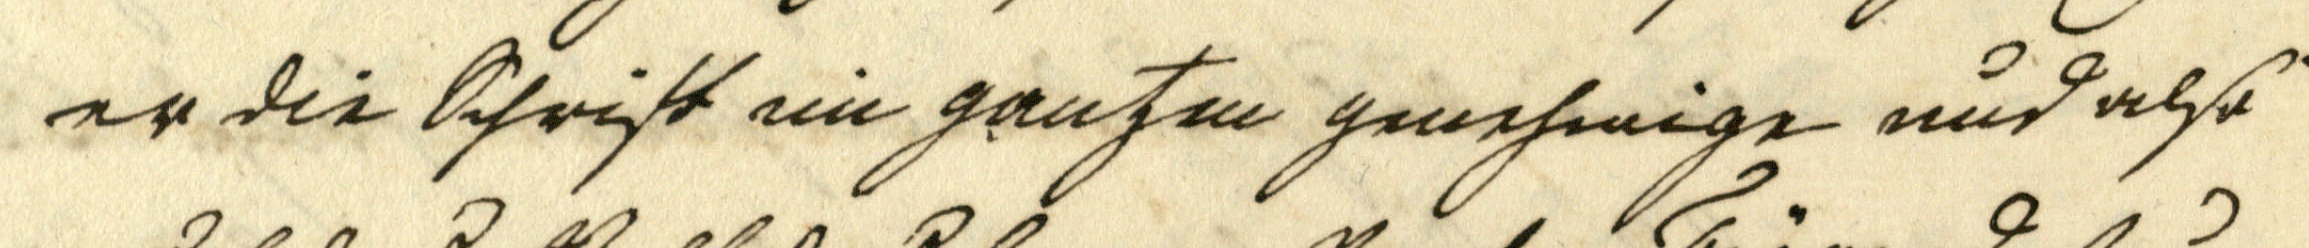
er die Schrift im gantzen genehmige und also
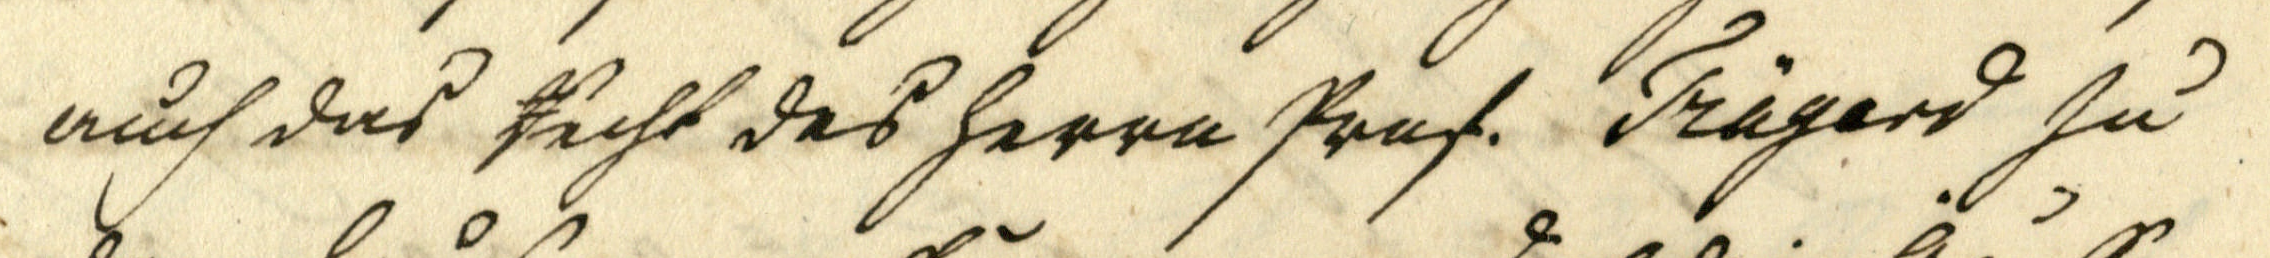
auch das Recht des Herrn Prof. Trägård zu
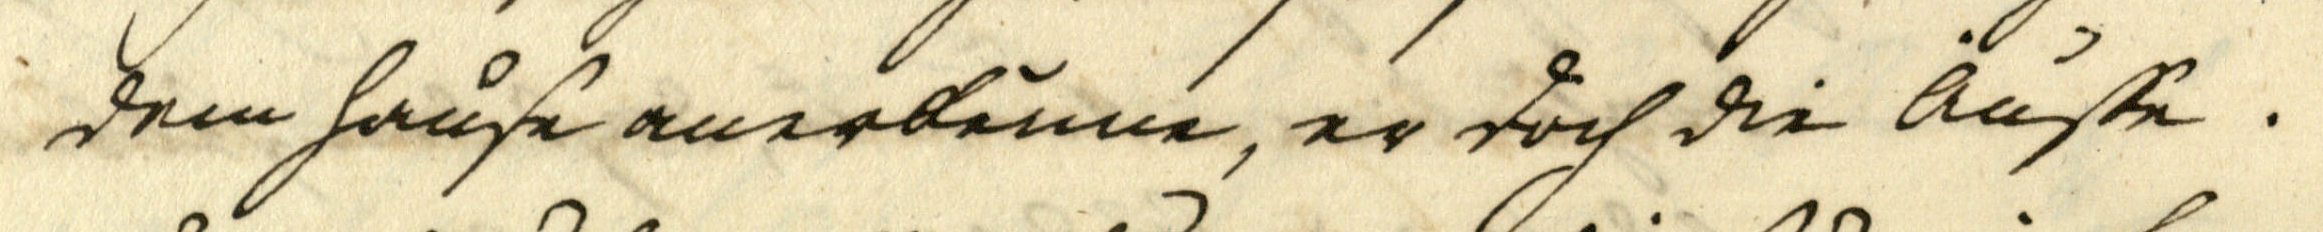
dem Hause anerkenne, er doch die Äusse¬
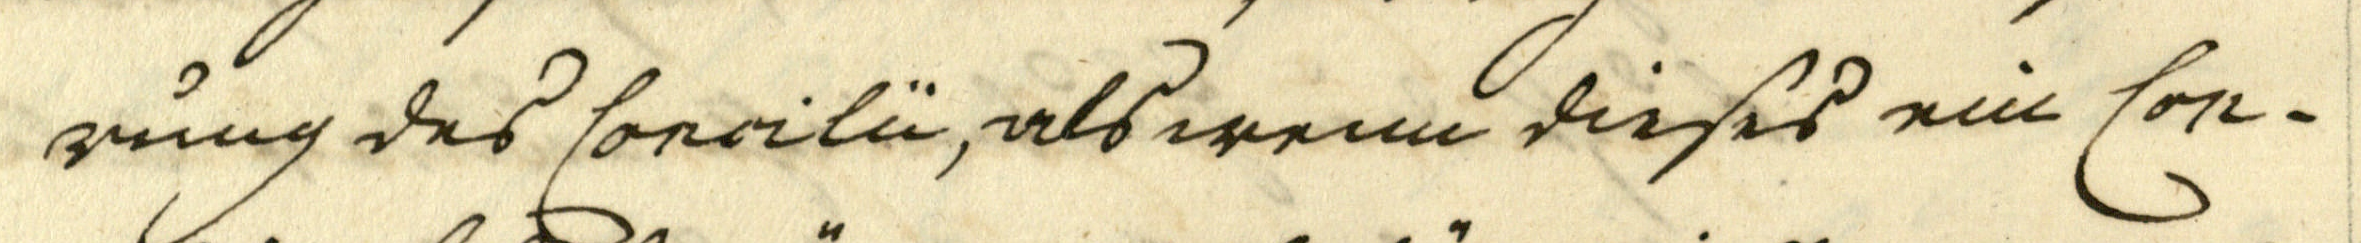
rung des Concilii, als wenn dieses ein Con¬
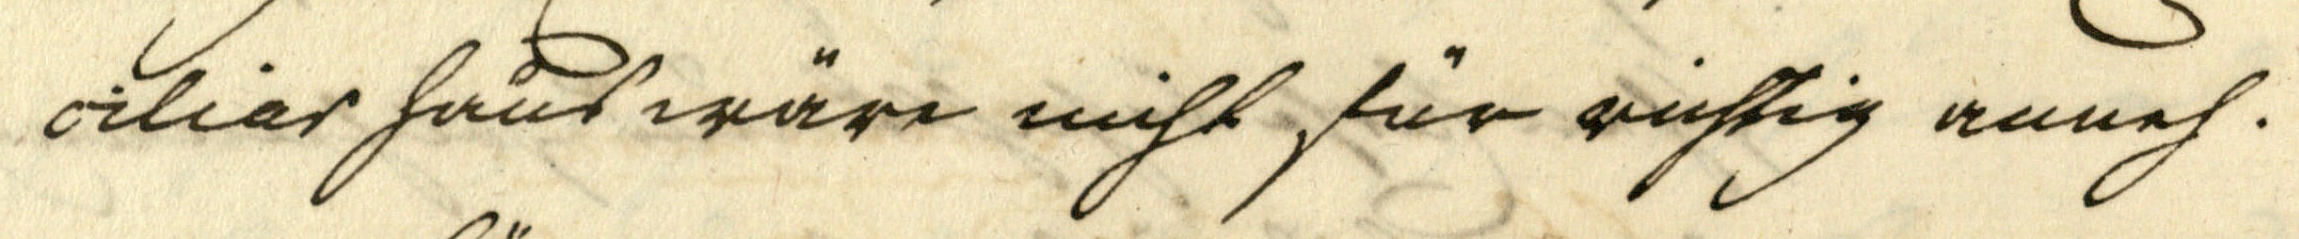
ciliar Haus wäre nicht für richtig anneh
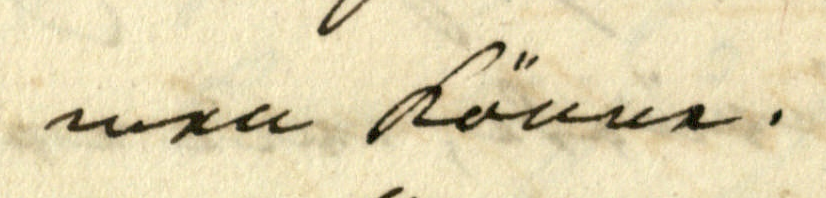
men könne.
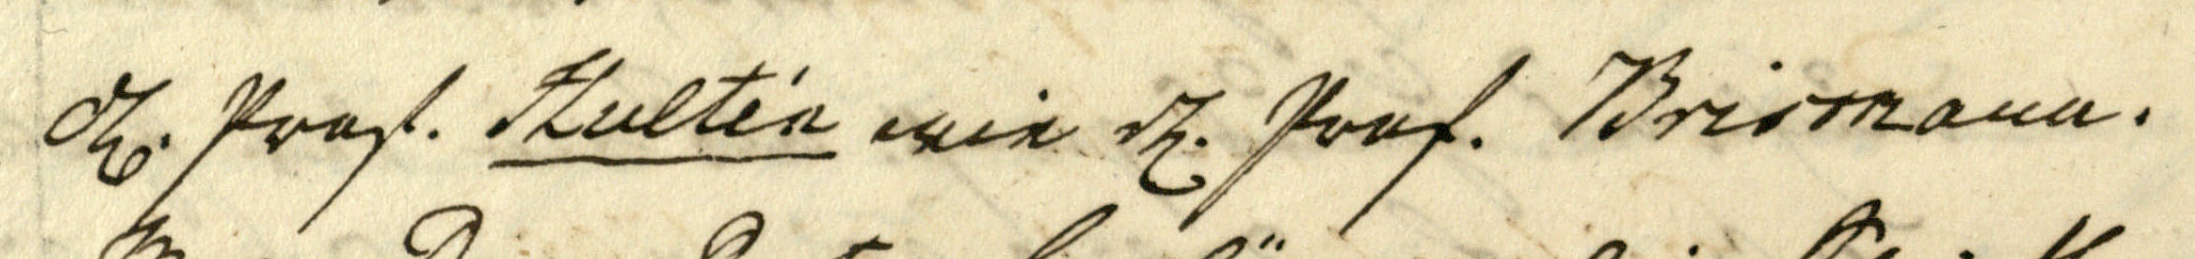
dh. Prof. Hultén wie dh. Prof. Brismann.
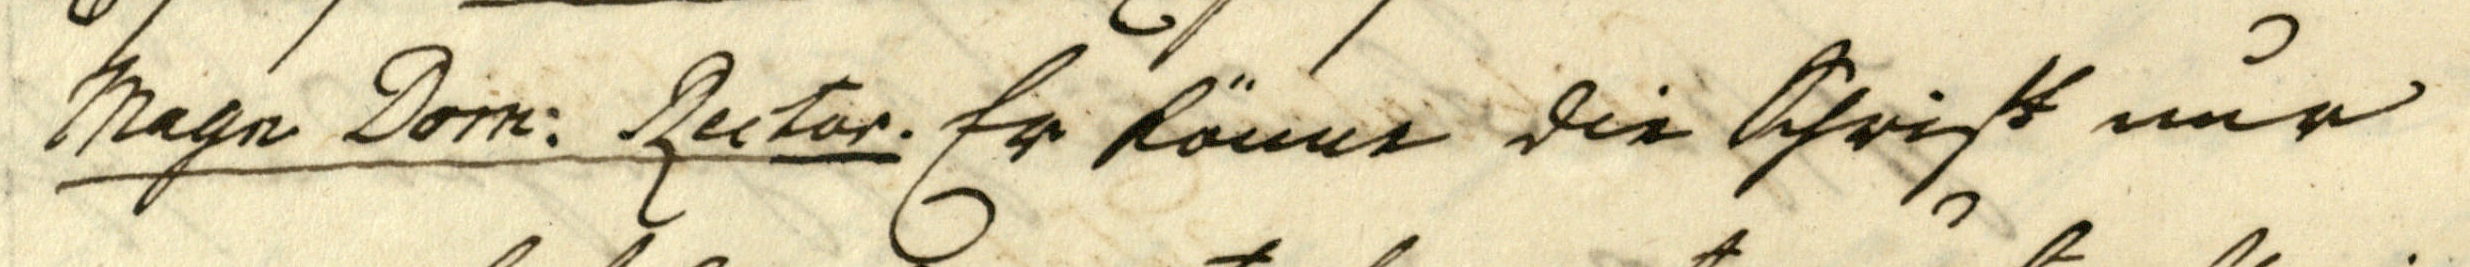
Magn Dom. Rector Er könne die Schrift nur
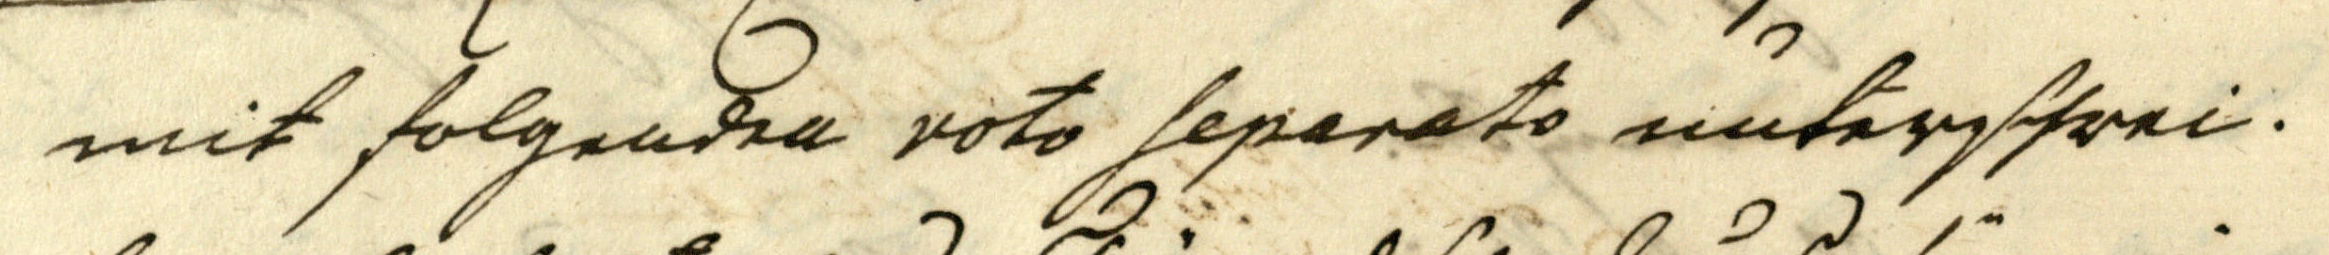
mit folgenden voto separato unterschrei¬
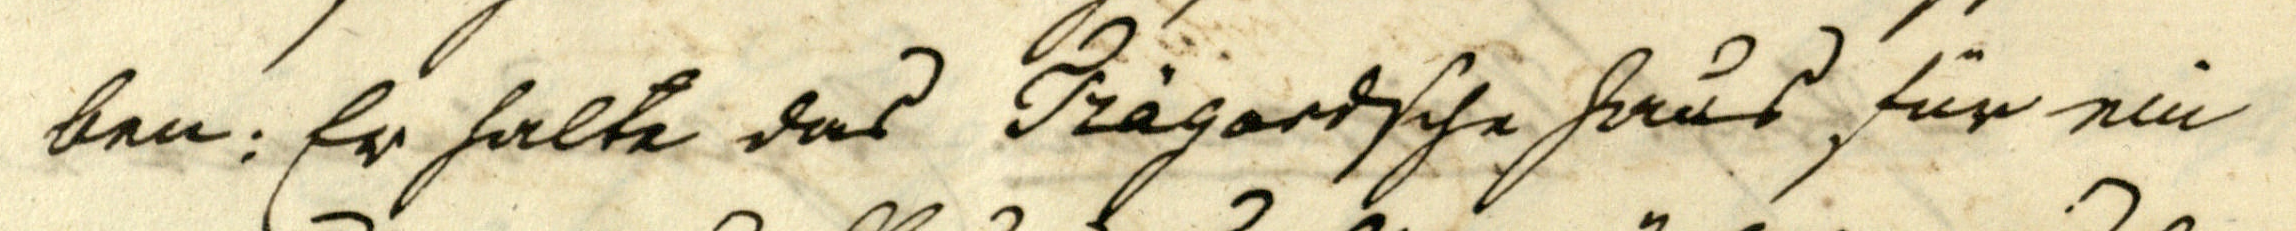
ben: Er halte das Trägårdsche Haus für ein
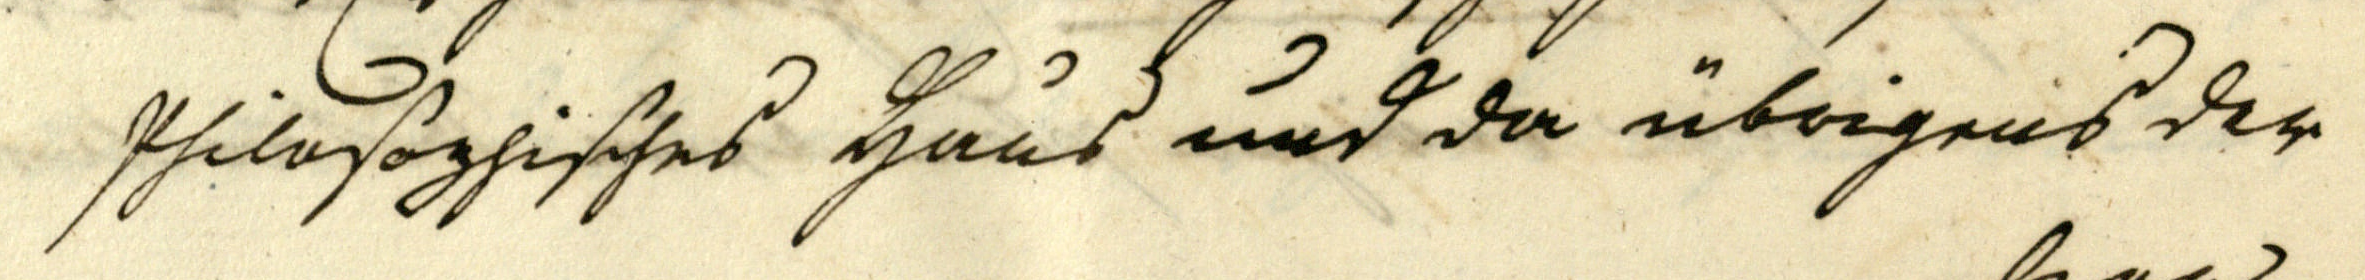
Philosophisches Haus und da übrigens der
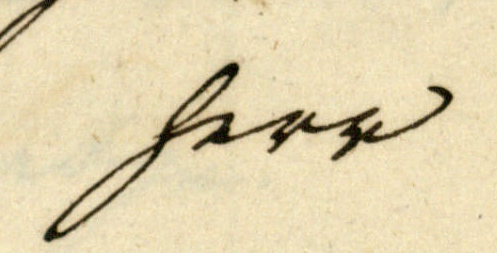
Herr
